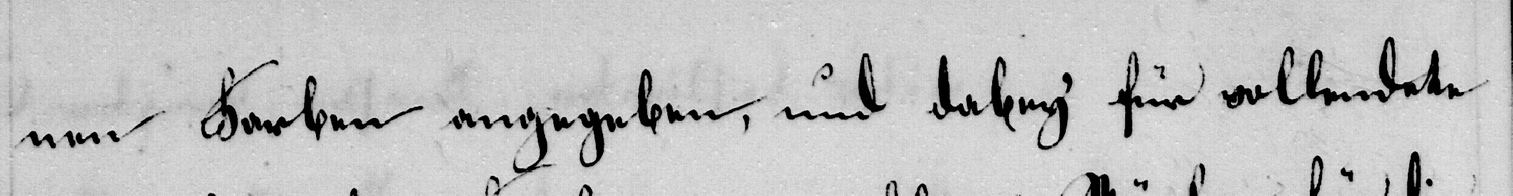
nen Farben angegeben, und dabey für vollendete
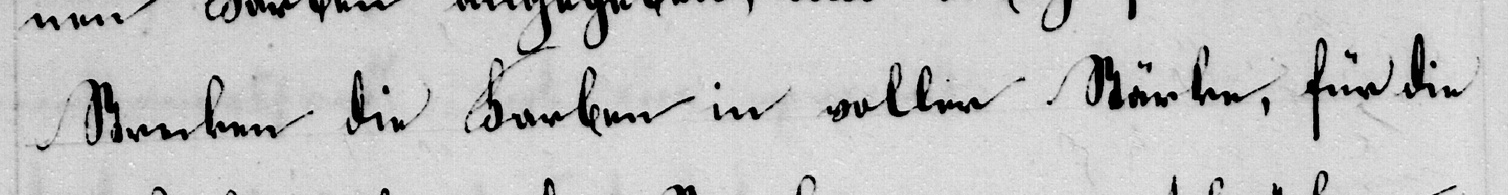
Strecken die Farben in voller Stärke, für die
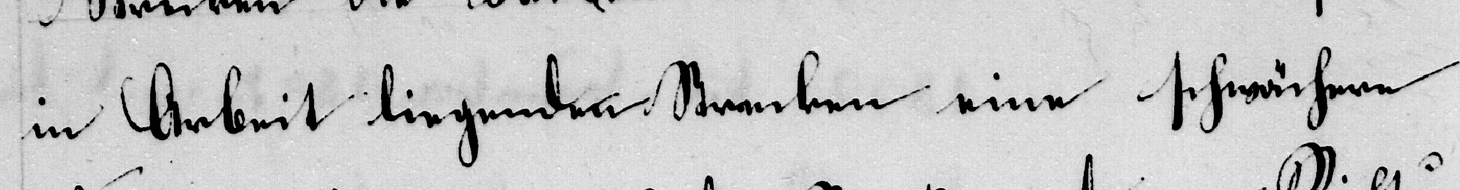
in Arbeit liegenden Strecken eine schwächere
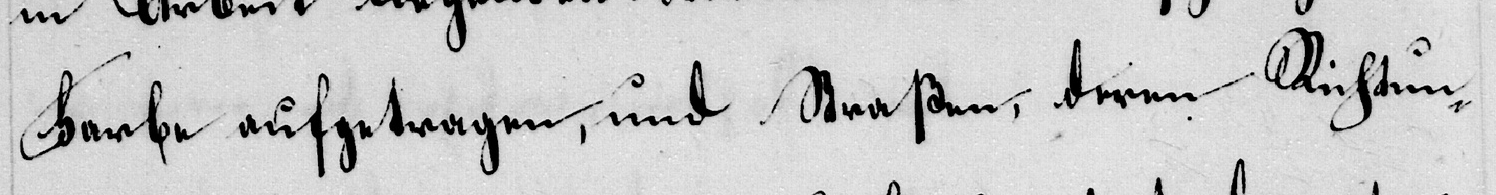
Farbe aufgetragen, und Straßen, deren Richtun¬
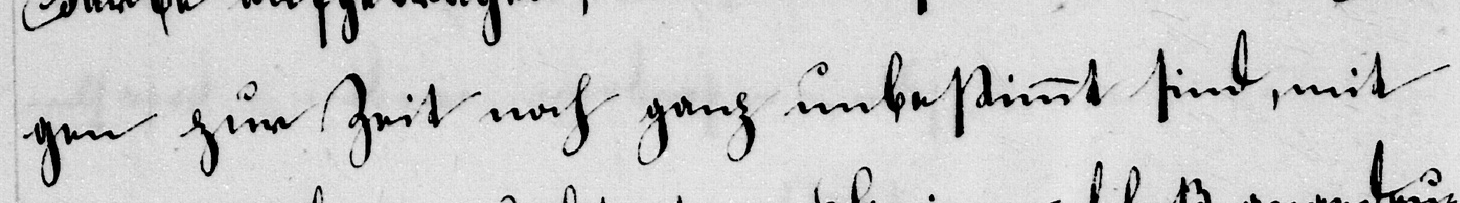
gen zur Zeit noch ganz unbestimmt sind, mit
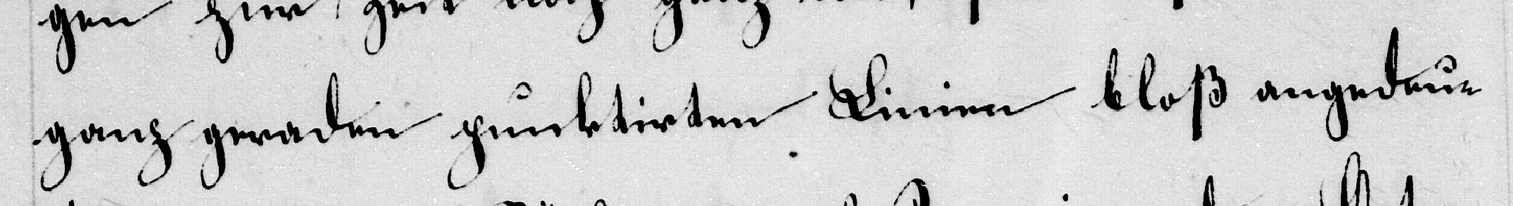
ganz geraden punktirten Linien bloß angedeu¬
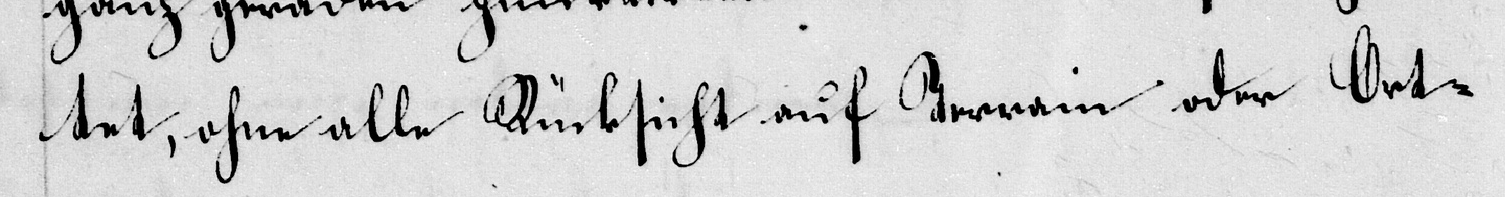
tet, ohne alle Rücksicht auf Terrain oder Ort¬
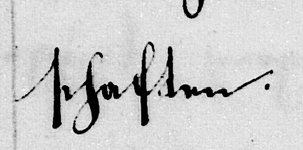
schaften.
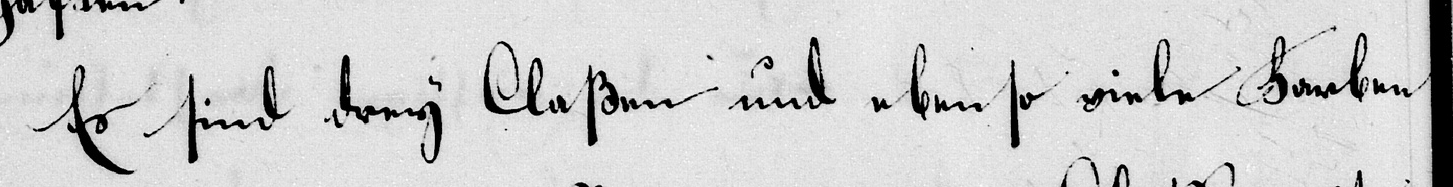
Es sind drey Claßen und ebenso viele Farben
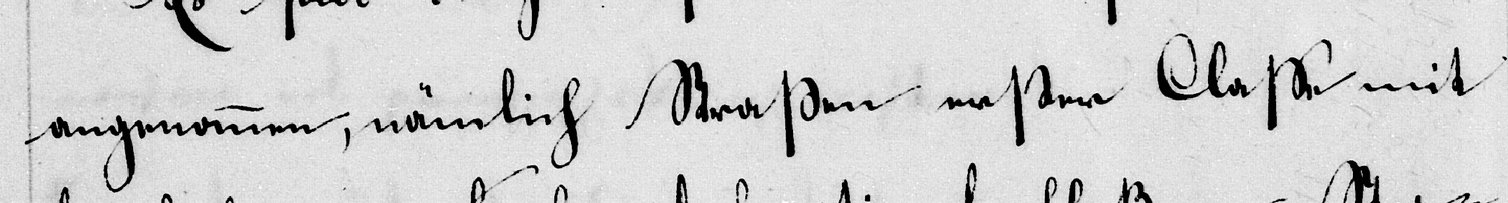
angenommen, nämlich Straßen erster Claße mit
